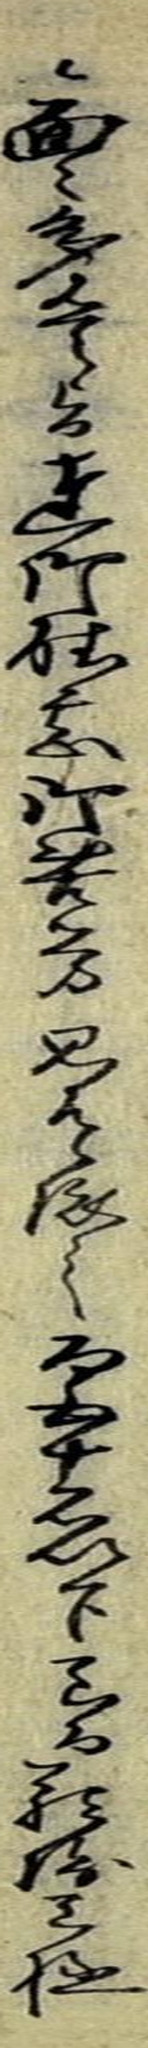候面々多有之旨達御聴甚御苦労思召候依之百五十石以下至而難儀至極
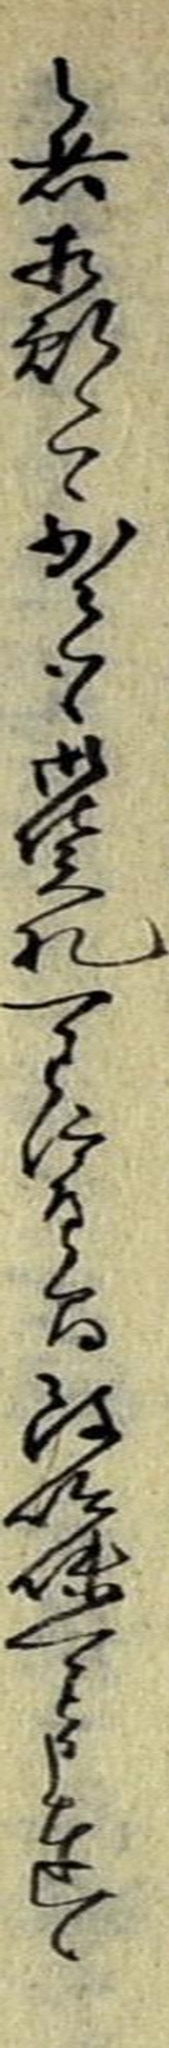之者相願候ハヽ少々ツヽ御貸札可被仰付候間致吟味可被申達候
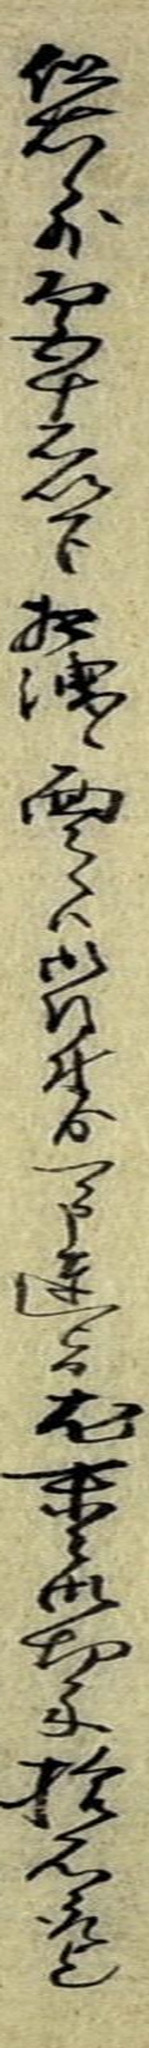但右之外百五十石以下相洩候面々ヘハ御目付ゟ可申達旨尤末々御切米拾石取迄
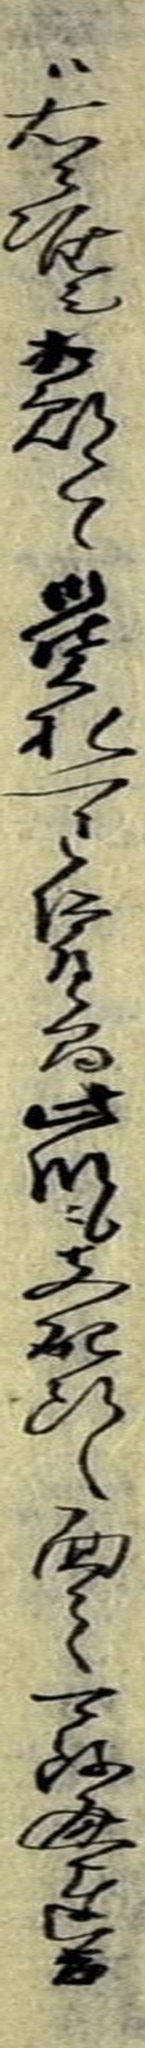ハ右ニ准シ相願候ハヽ御貸札可被仰付候間此段も支配頭之面々へ可致通達旨
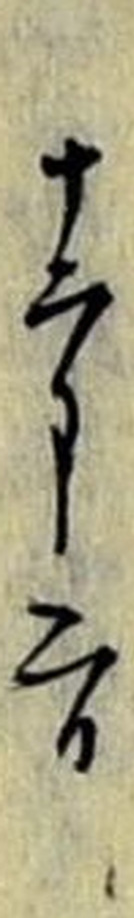十二月二日
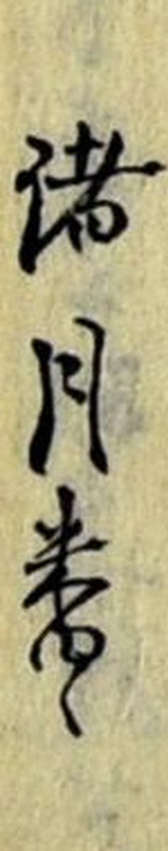諸月番へ

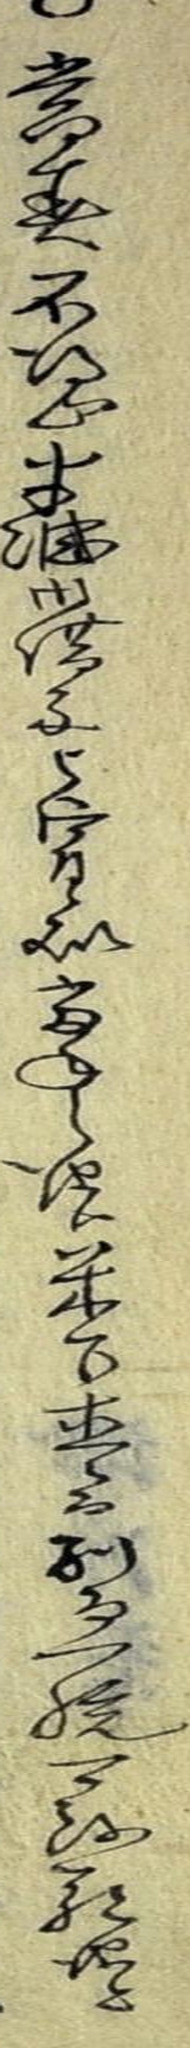〇当春不得止半減御借米被仰付候処当年之儀ハ米下直ニ而別而一統可致難儀と
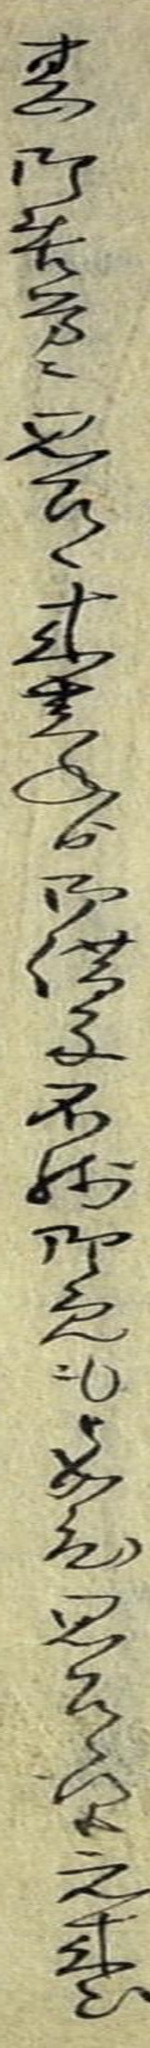甚御苦労ニ思召候来亥年ゟ御借米不残御免も被成度思召候得共元来至
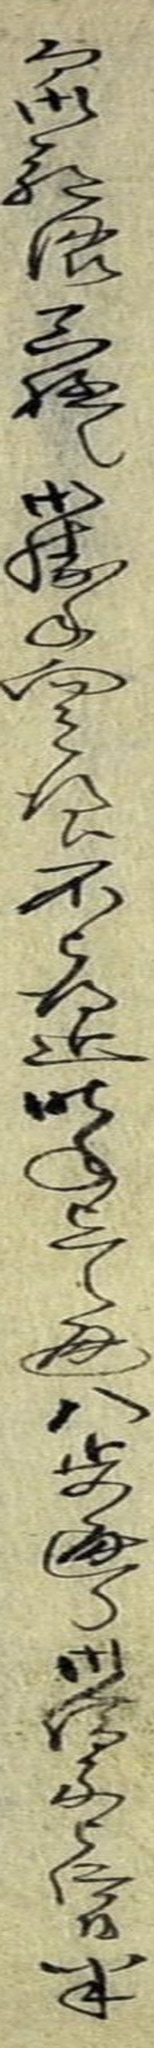而御難渋至極之御勝手向ニ候得ハ不被得止昨年迄之通八歩通リ御借米被仰付半
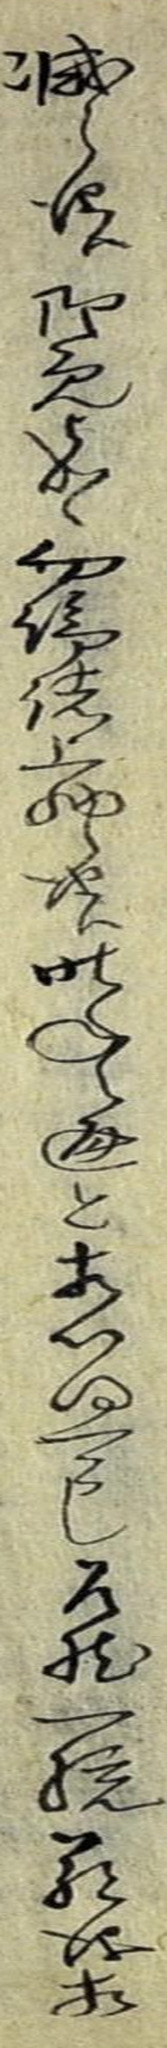減之儀ハ御免被成候勿論諸上納之儀ハ昨年之通と相心得可申候乍然一統難儀相
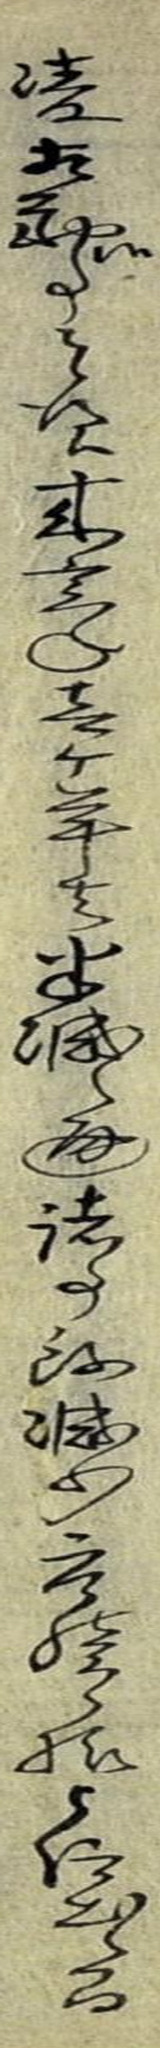凌相勤候事ニ候得ハ来亥年壱ケ年者半減之通諸事致減少取続候様被仰出候間
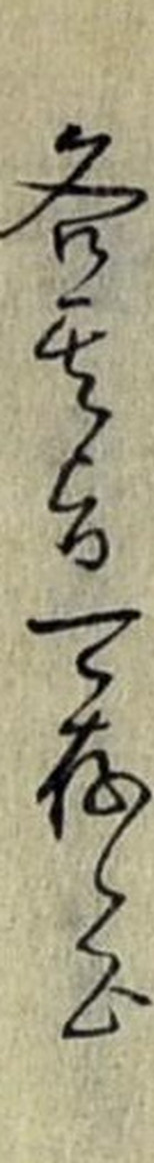各其旨可存候以上
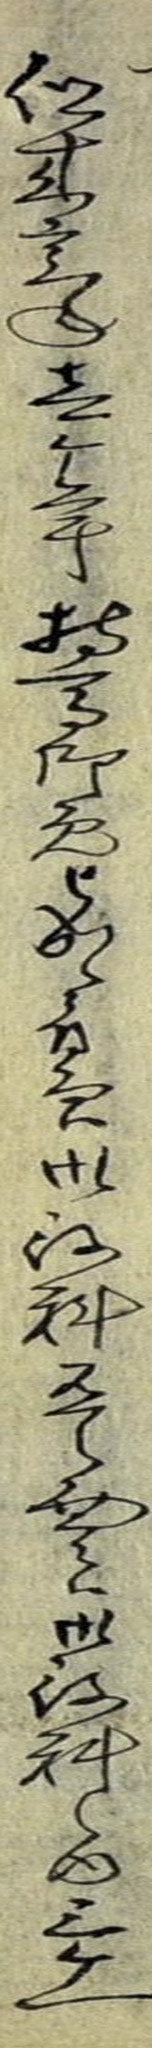但来亥年壱ケ年持馬御免被成候ニ付而ハ御役料有之面々ハ御役料之内三ケ一
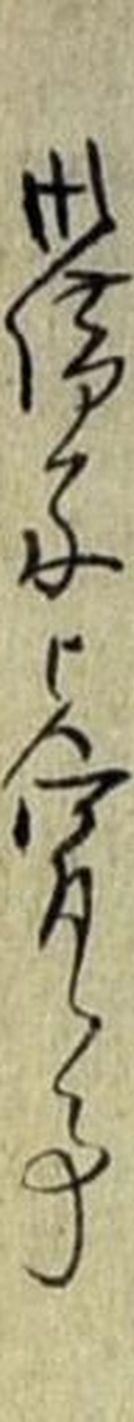御借米被仰付候事
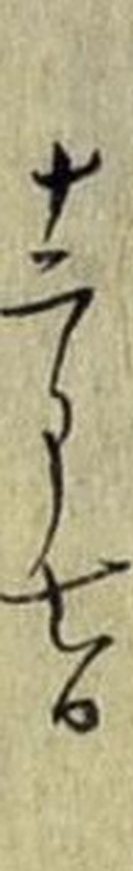十二月七日
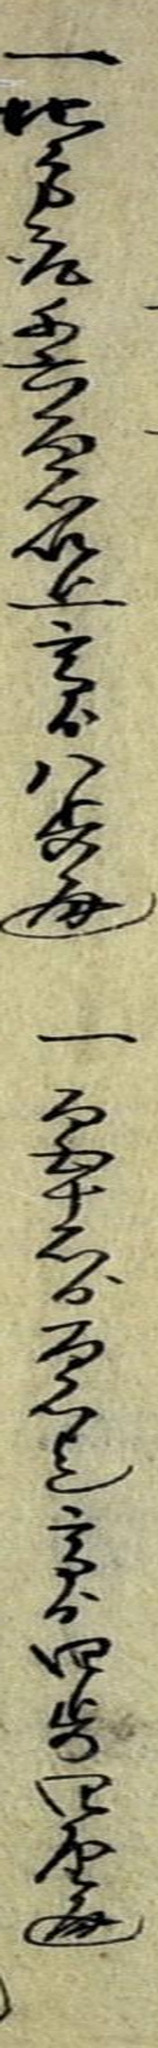一地方取千六百石以上高ゟ八歩通一百五十石ゟ百石迄高ゟ四歩四厘通
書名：命令之部 三
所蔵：福井県文書館 Fukui Prefectural Archives
